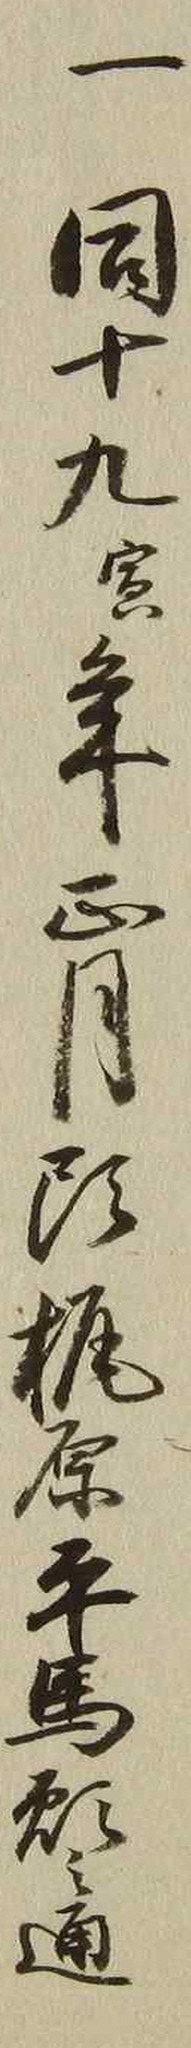一同十九寅年正月頭梶原平馬願之通
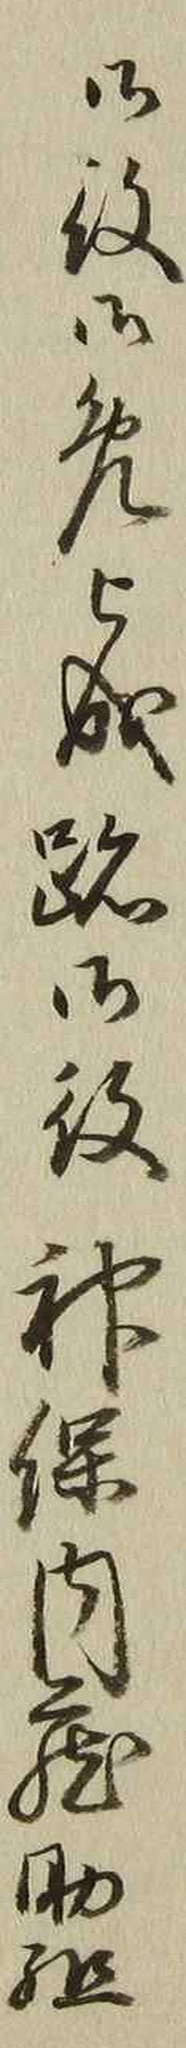御役御免被成跡御役神保内蔵助組
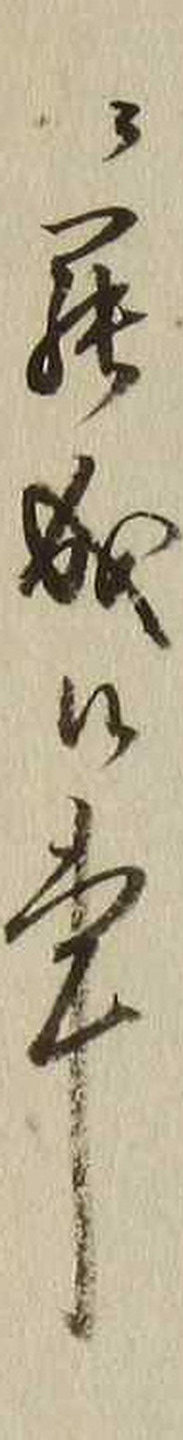に罷成候事
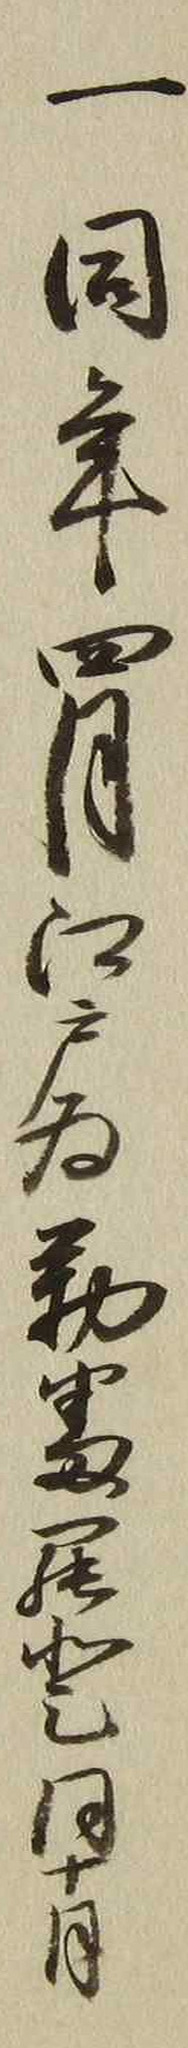一同年四月江戸為勤番罷登同十月
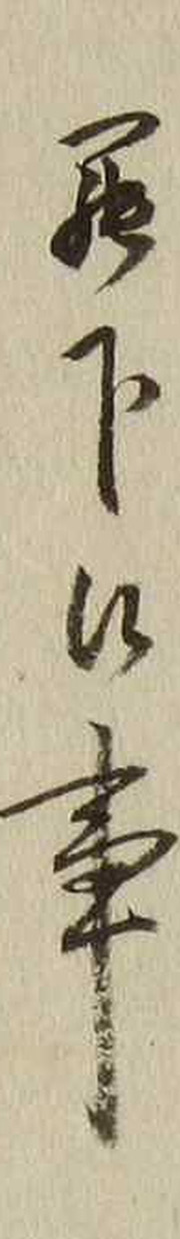罷下候事
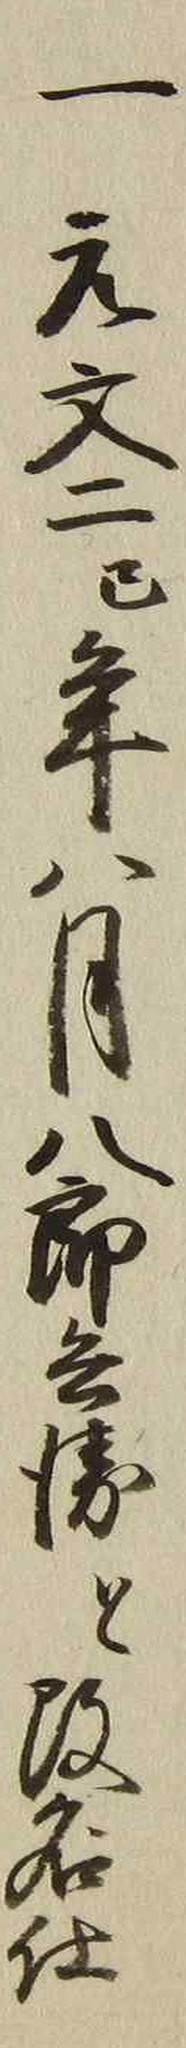一元文二巳年八月八郎兵衛と改名仕
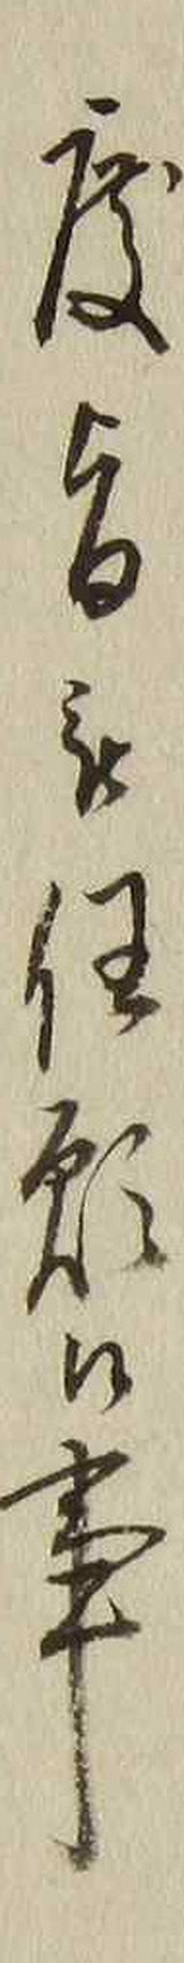度旨被任願候事
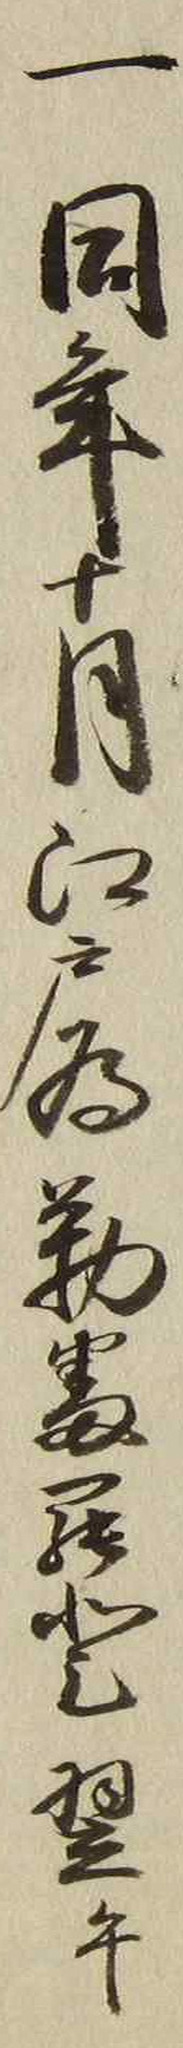一同年十月江戸為勤番罷登翌午
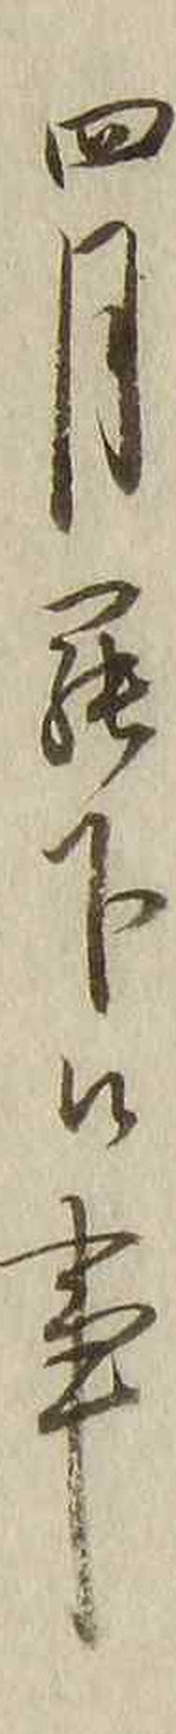四月罷下候事
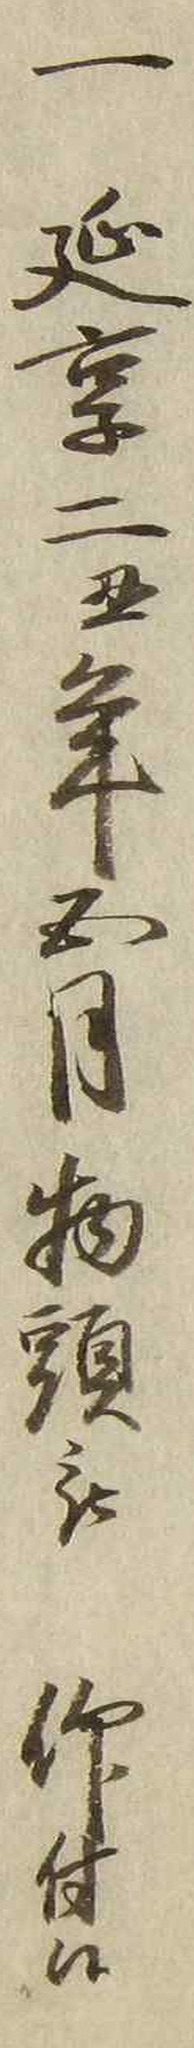一延享二丑年五月物頭被仰付候

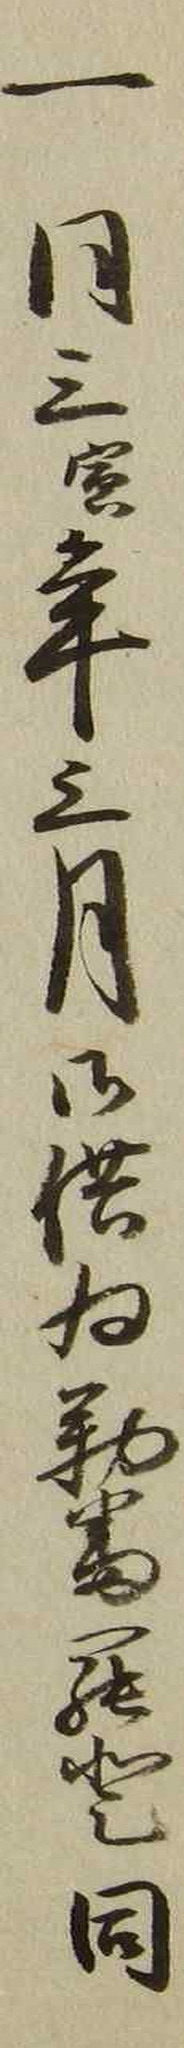一同三寅年三月御供為勤番罷登同
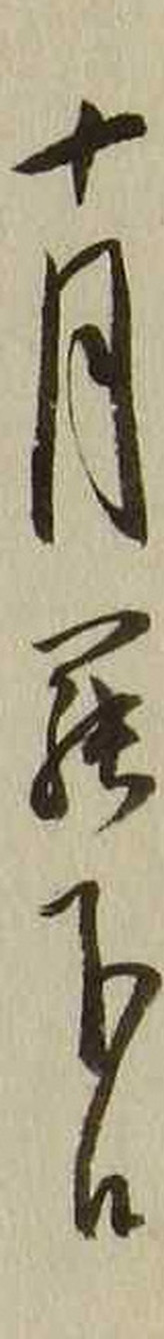十月罷下候
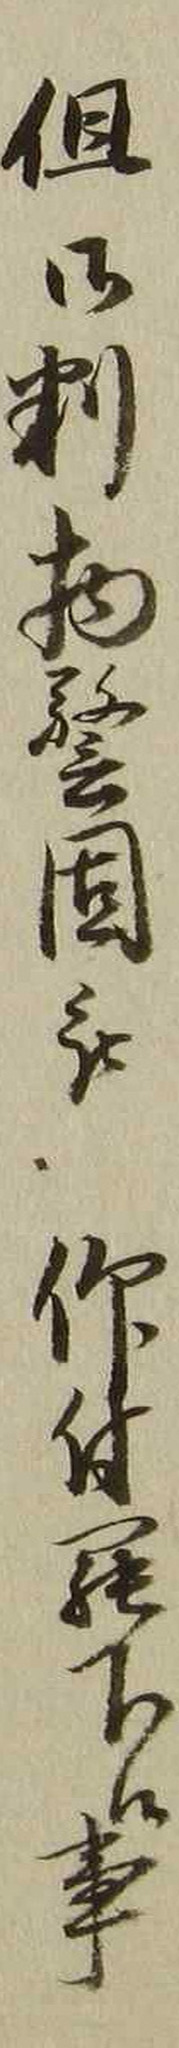但御判物警固被仰付罷下候事
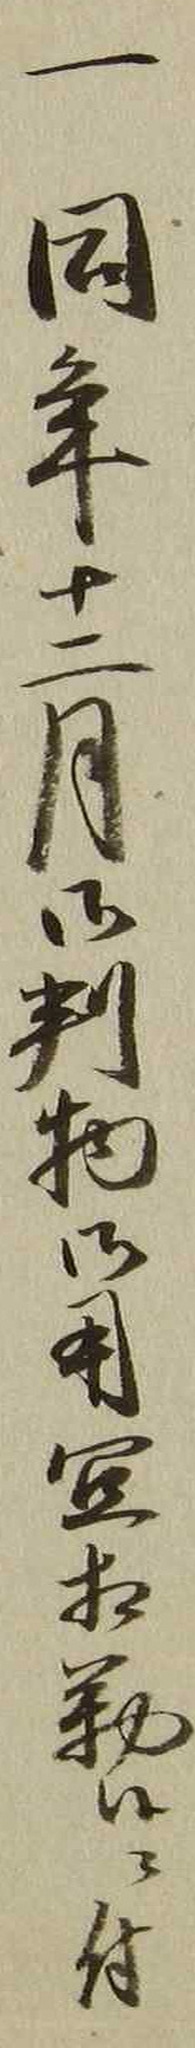一同年十二月御判物御用宜相勤候に付
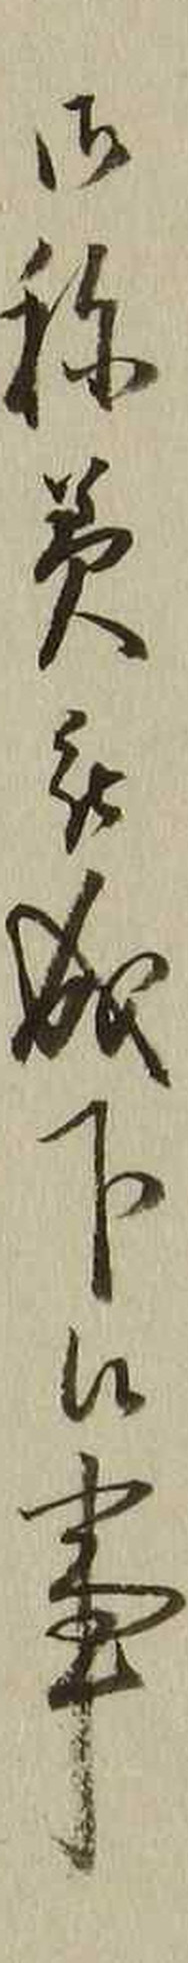御称美被成下候事
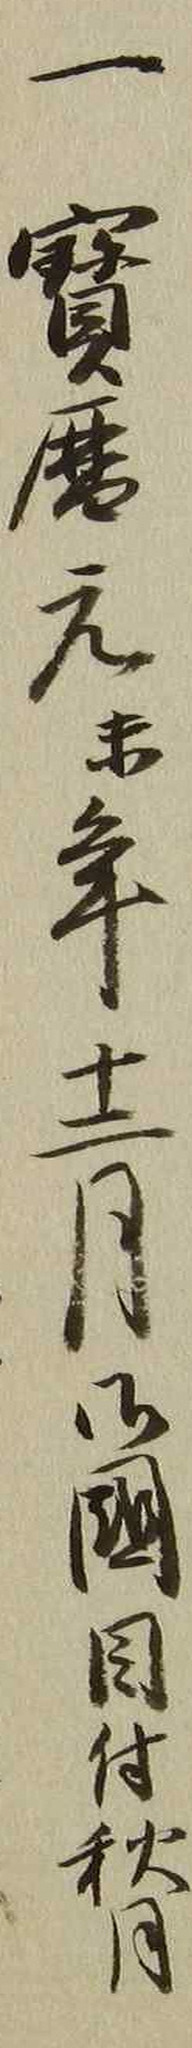一宝暦元末年十二月御国目付秋月
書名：諸士系譜　巻之133　た之部9
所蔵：会津若松市立会津図書館
